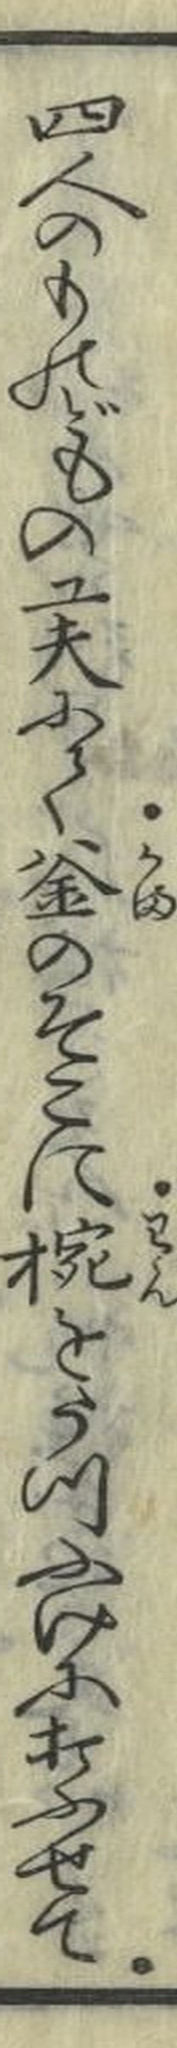四人のものどもの工夫にて・釜のそこに・椀をうつふけに打ふせて・
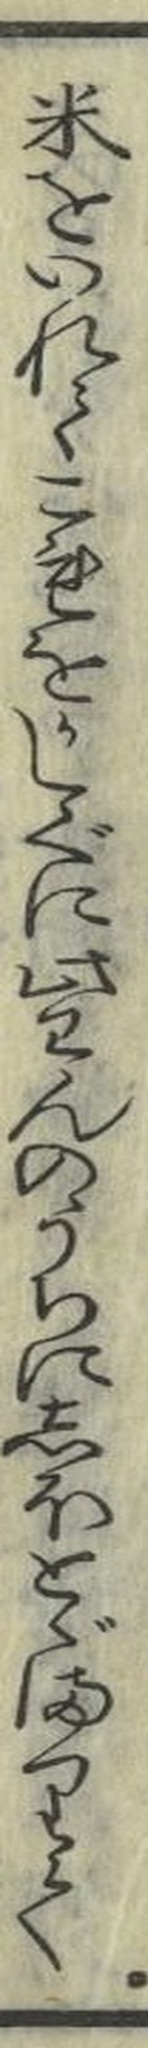米をいれてこれをかしぐに・此わんのうちにしほとゞまりて・
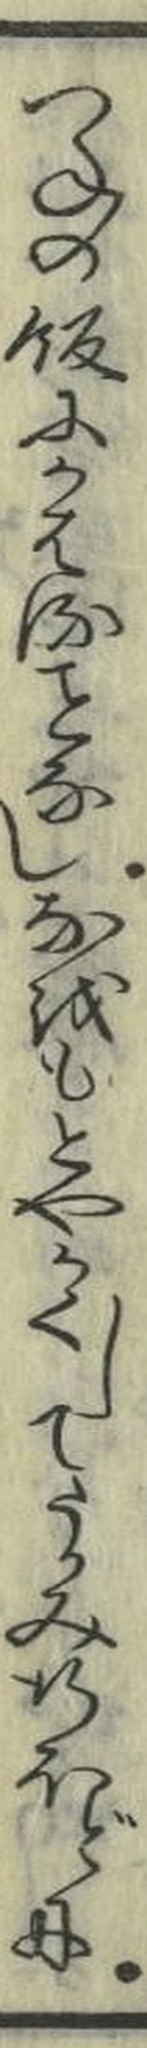つねの飯にかはることなし・なをもとやかくしてうかみ行ほどに・
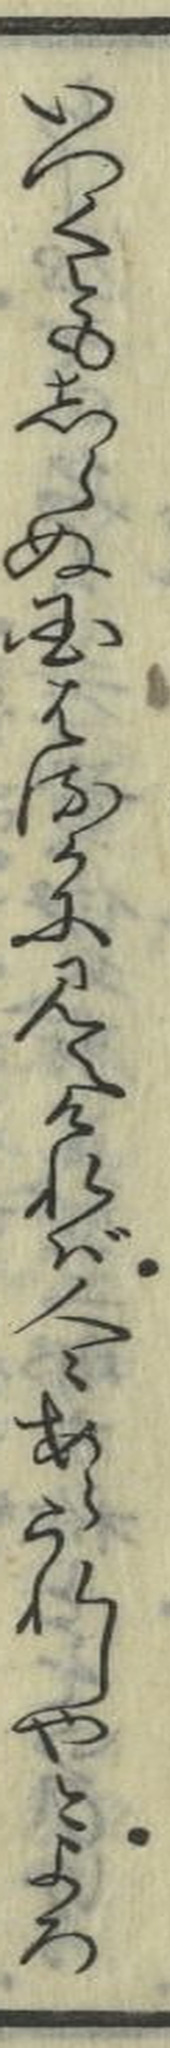いつくともしらぬ国はるかに見えければ・人々あらうれしやと・よろ
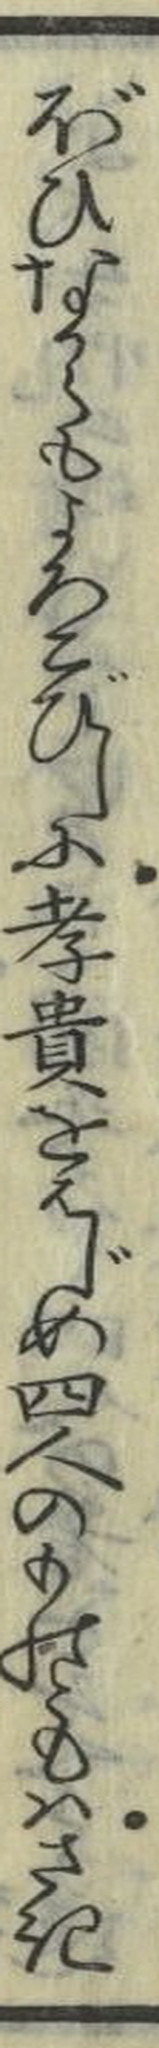ぼひなからもよろこびしに・孝貴をはじめ四人のものともは・さき
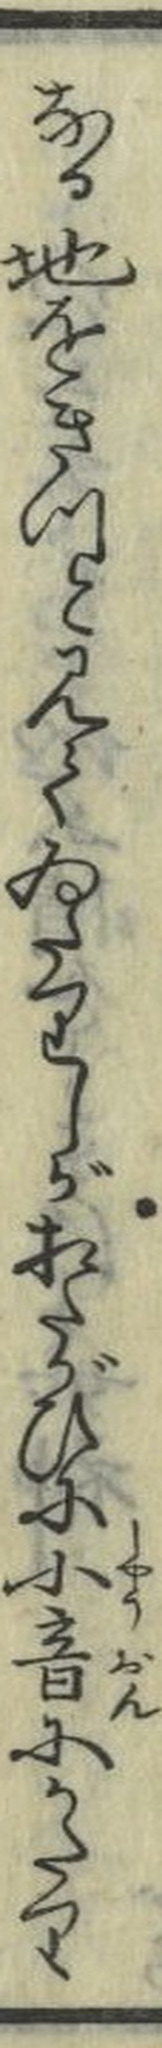なる地をきつと見てゐたりしが・おたがひに小音にかたり
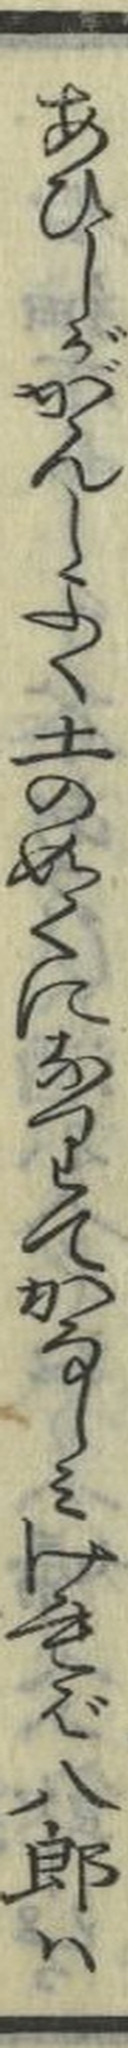あひしが・がんしよく土の如くになりてかなしみければ・八郎は
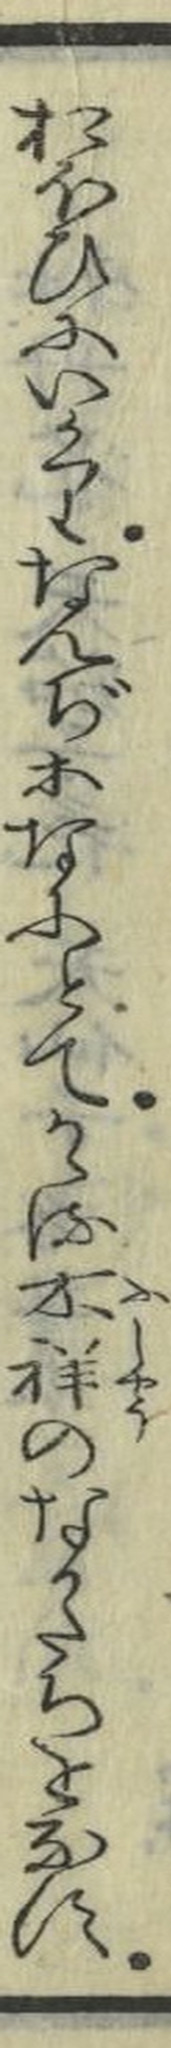おほひにいかり・なんぢ等なにとて・かゝる不祥のなかたちをなす・
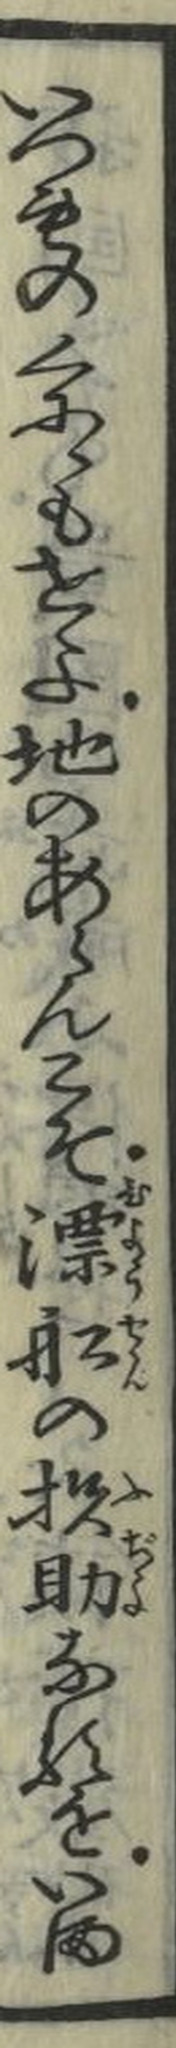いつものくにゝもせよ・地のあらんこそ・漂船の扶助なるを・いま
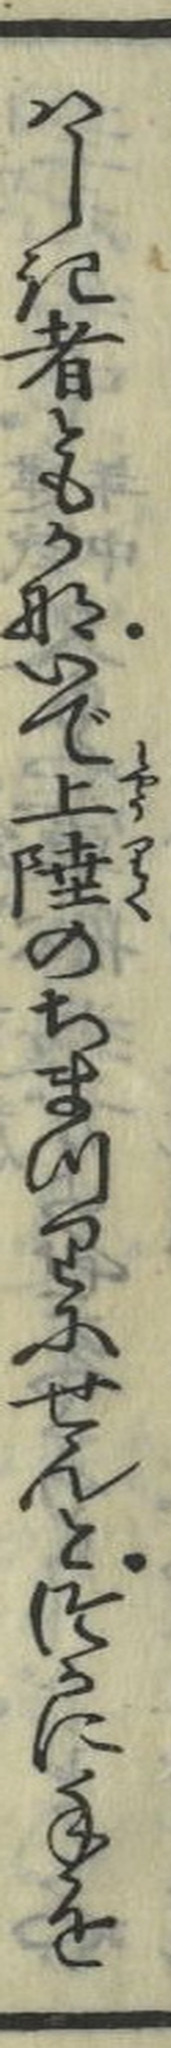はしき者ともかな・いで上陸のちまつりにせんと・つかに手を
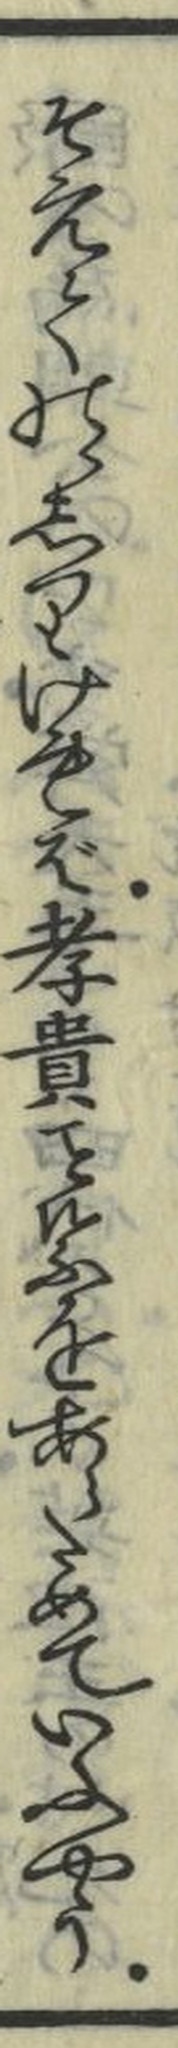そえてのゝしりければ・孝貴ことはをあらためていふやう・
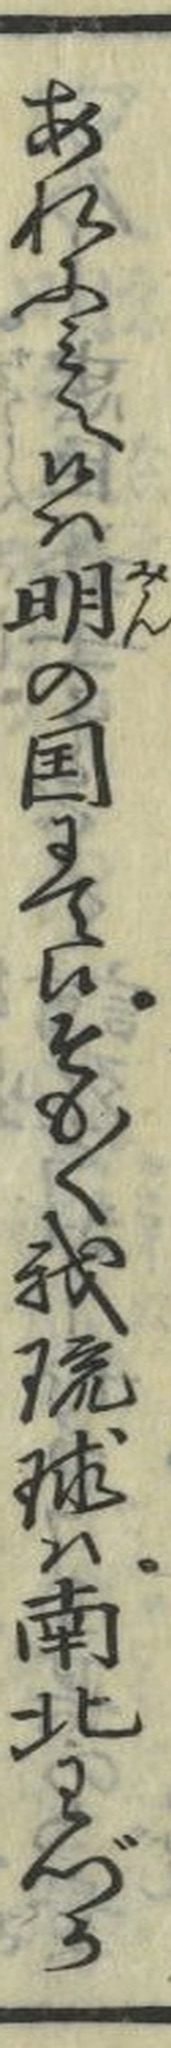あれにみえ候は明の国にて候・そも〳〵我琉球は・南北わづか
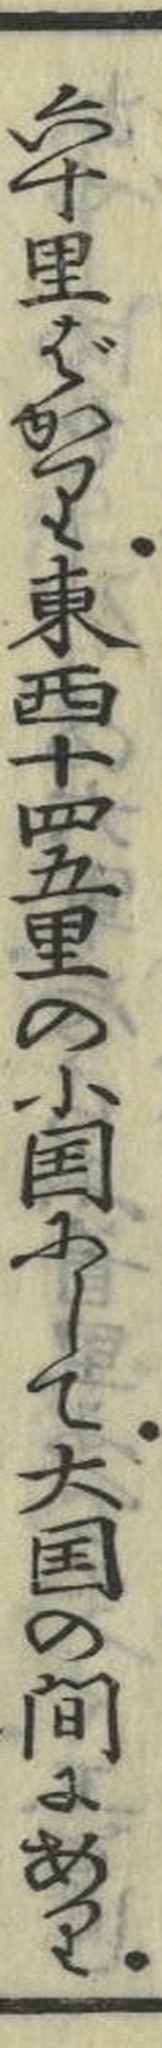六十里ばかり・東西十四五里の小国にして・大国の間にあり・
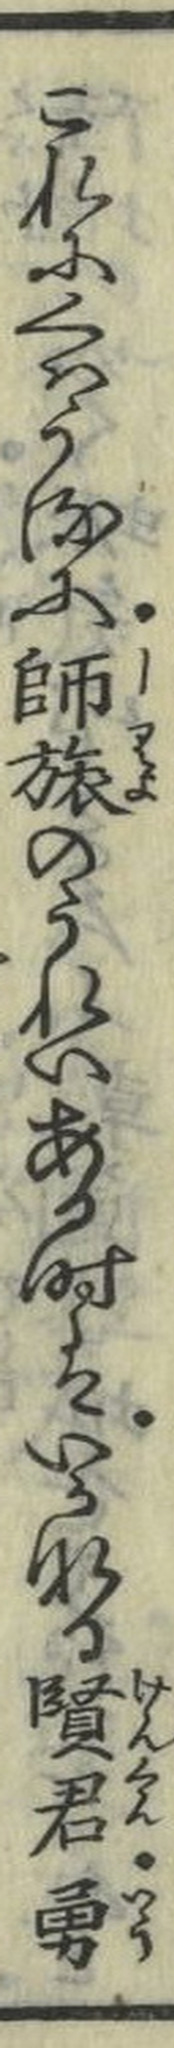これにくはうるに・師旅のうれいある時は・いかなる賢君・勇
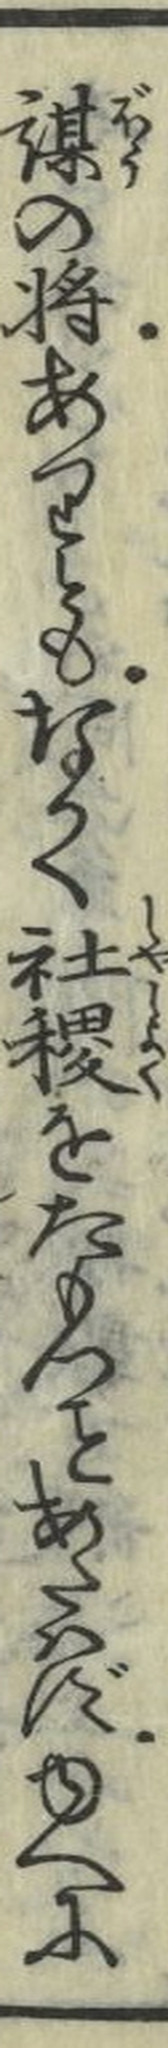謀の将・ありとも・なかく社稷をたもつことあたはず・ゆへに
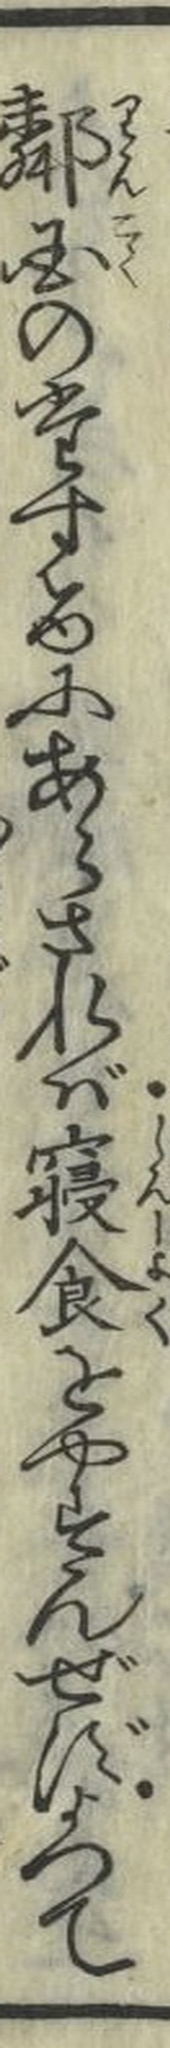鄰国のたすけにあらされば・寝食をやすんぜず・よつて
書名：琉球秊代記 附雑話 全
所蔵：University of the Ryukyus Library
